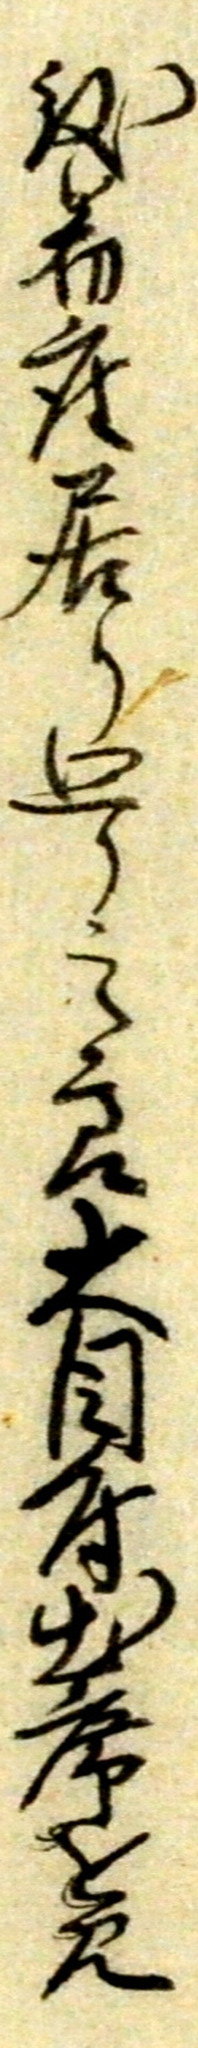致着座居り廻り之節大目付出席を見
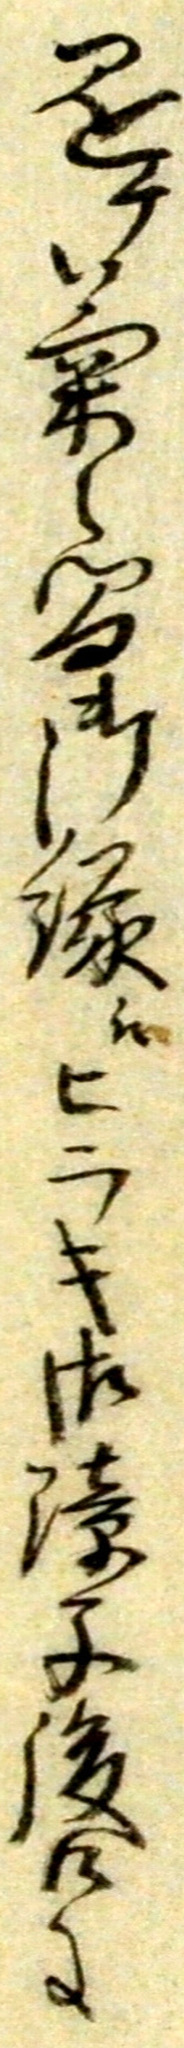懸ケ菊之間御江ヒラキ御障子後ロニ
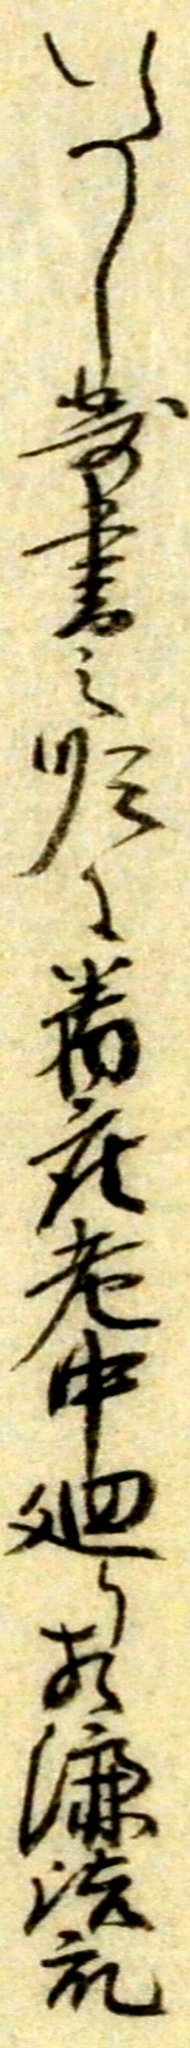いたし寄書之順着座老中廻り相済御礼
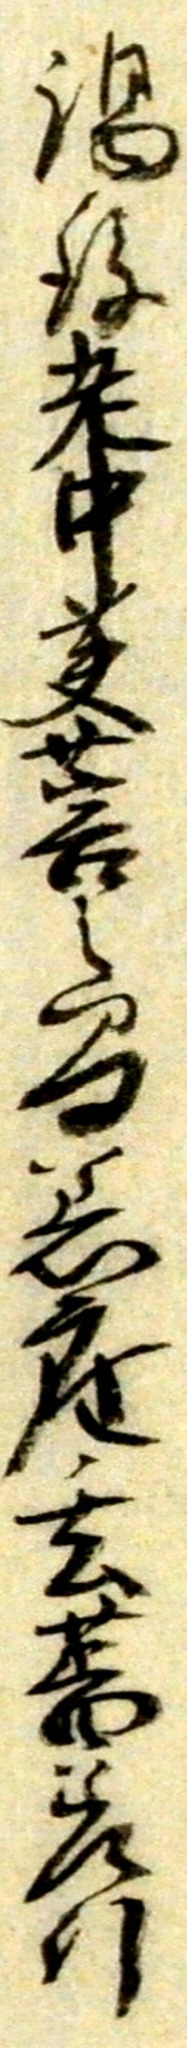謁後老中芙蓉之間着座玄蕃差引
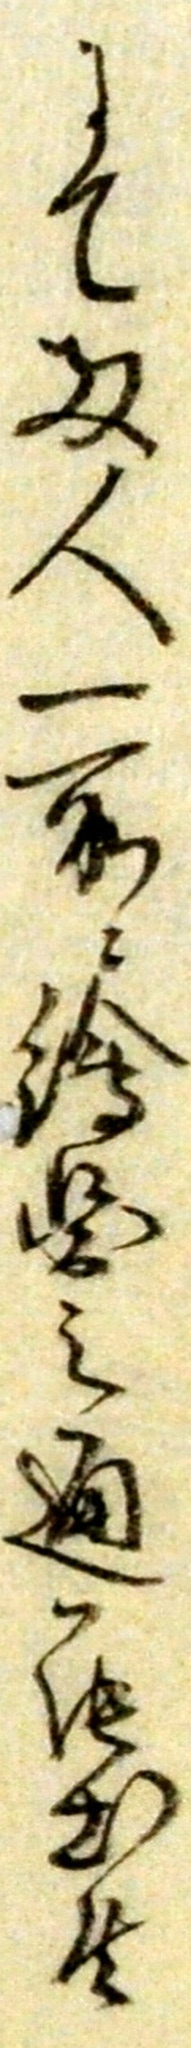にて両人一所ニ絵図之通罷出候

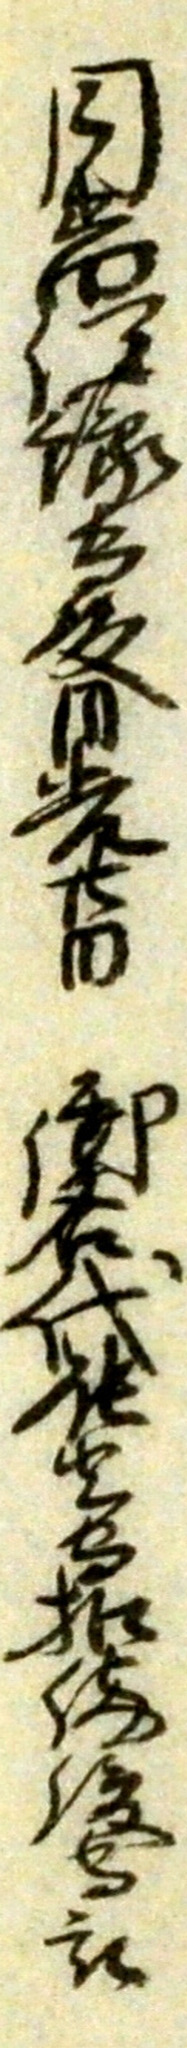月番伊豫守殿日光廿日御名代能登守扣備後守被
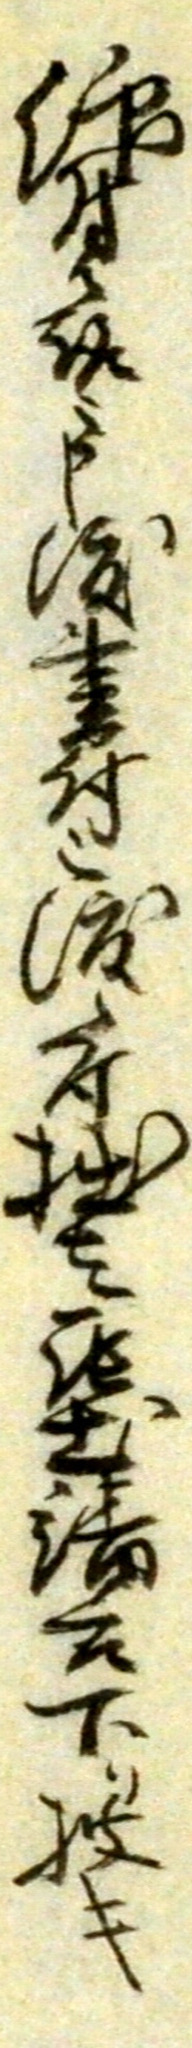仰付之趣被申渡書付御渡ニ付拙者罷出請取下り披キ
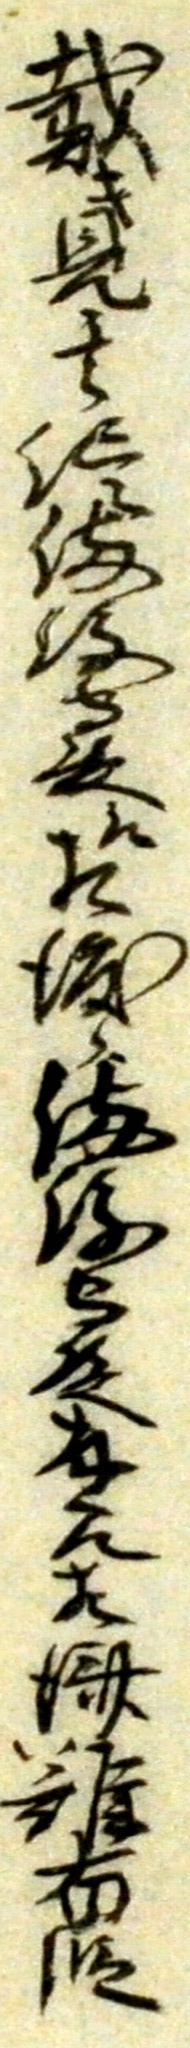戴キ見其侭備後守殿江相渡備後守殿拝見相済難有段
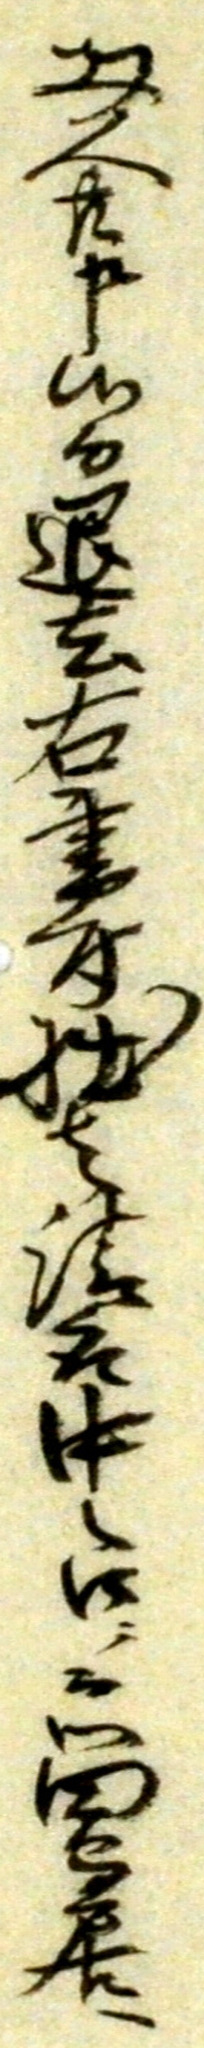両人共申候而退去右書付拙者請取中之口ニ而御留守居へ
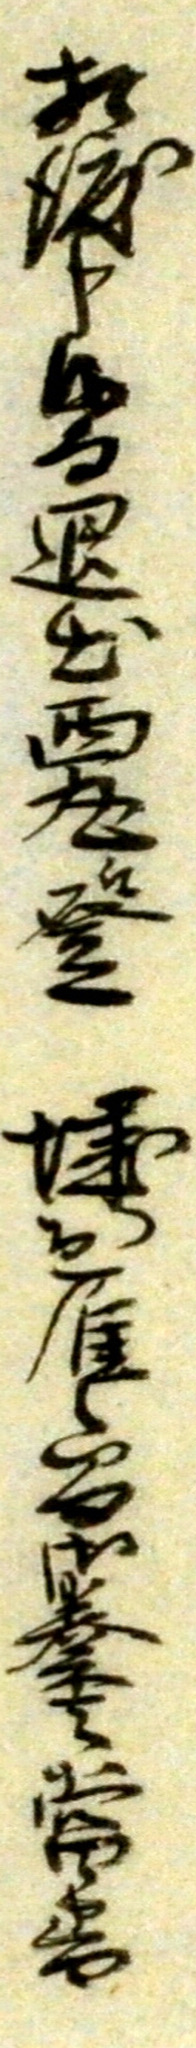相渡候而退出西丸江登城於雁之御奏者當番
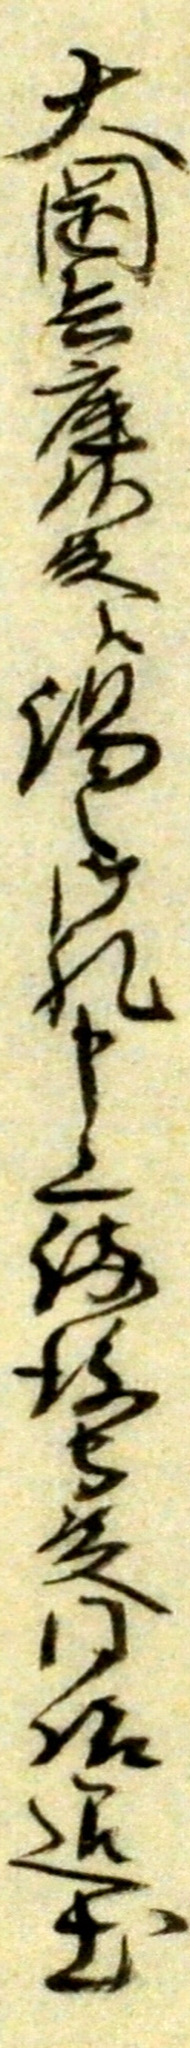大岡兵庫守殿江謁之御礼申上備後守殿同様退出
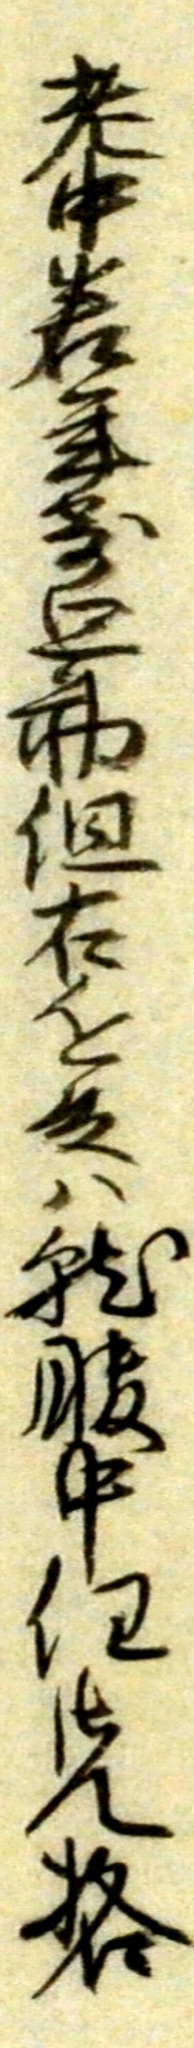老中若年廻勤但右近殿ハ就服中但任先格
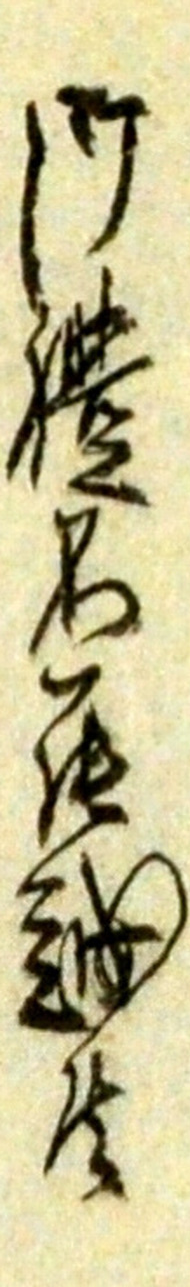御禮不罷越候
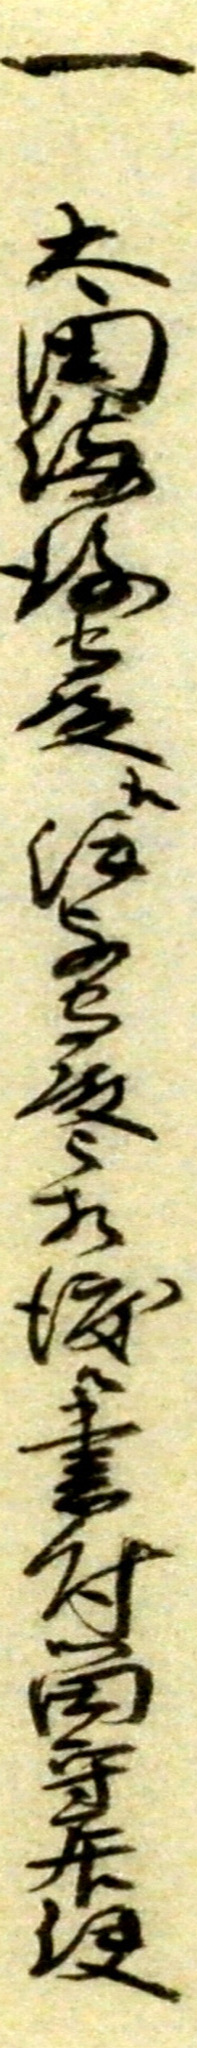一太田備後守殿江伊与守殿被相渡而書付留守居使
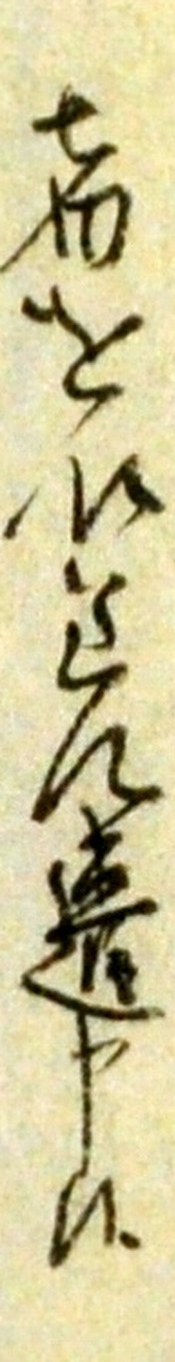者を以差遣申候
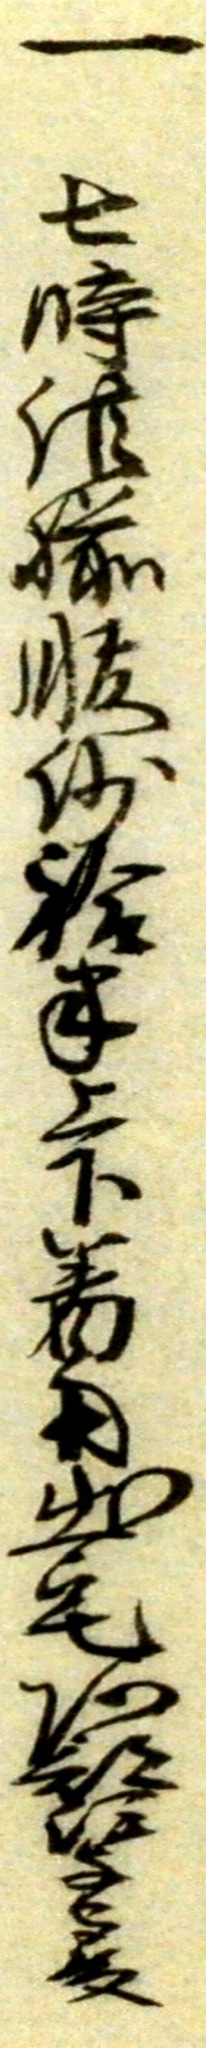一七時供揃服紗袷半上下着用出宅阿部伊与守殿
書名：日光御名代相勤候節ノ留
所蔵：伊那市立高遠町図書館・合同会社AMANE
